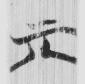亓
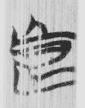良
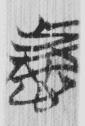𢝬
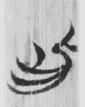此
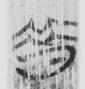昔
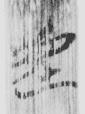𫊟
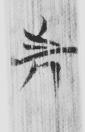先
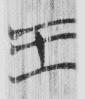王
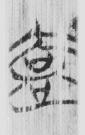盍
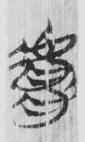膚
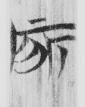所
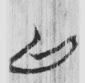㠯（以）
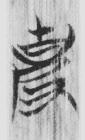尅
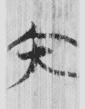內
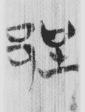郢
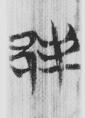邦
